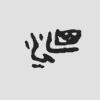{水𠃊𠃊日}
